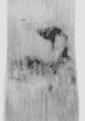{十六}
